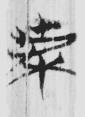枼
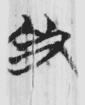及
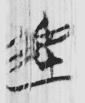𫊟
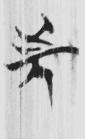先
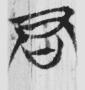君
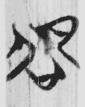{召㔾}
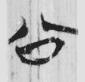公
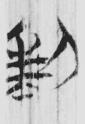{朱刀}
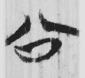公
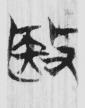殹
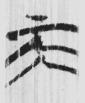天
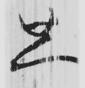也
